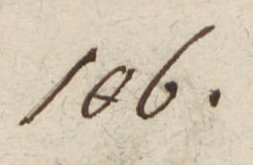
106.
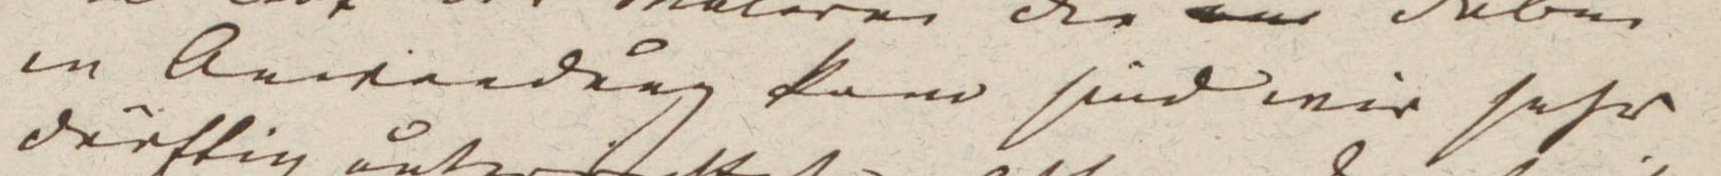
in Anwendung kam sind wir sehr
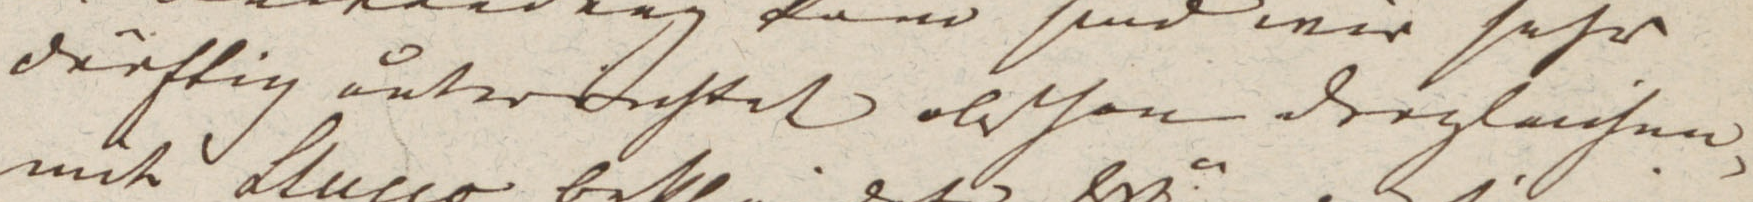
dürftig unterrichtet obschon dergleichen,
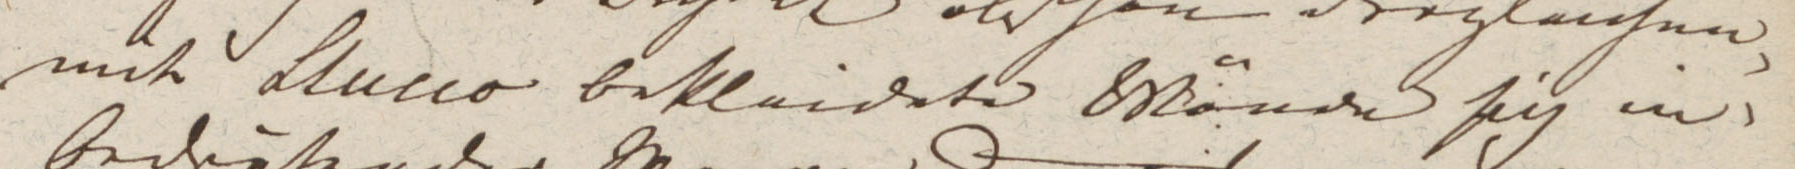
mit Stucco bekleidete Wände sich in
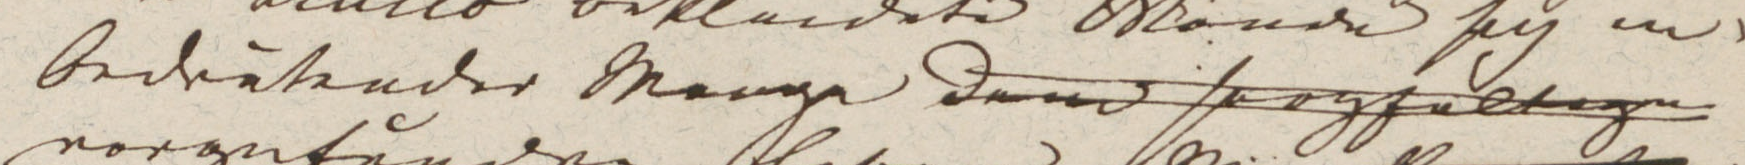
bedeutender Menge dem sorgfältige
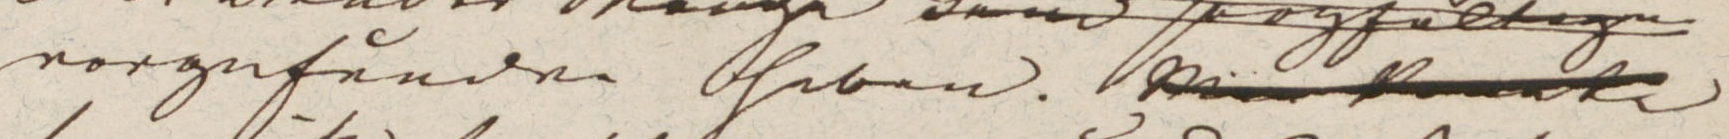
vorgefunden haben. Man konnte
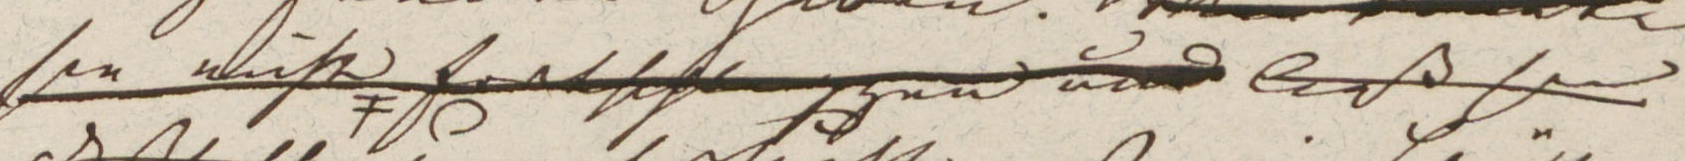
sie nicht fortschleppen und liess sie
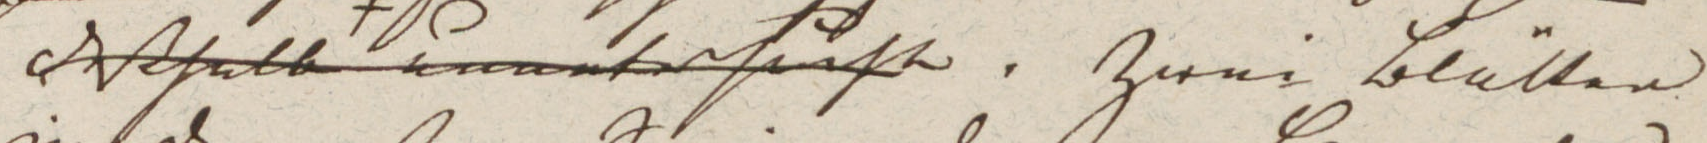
dasselbe ununtersucht. % Zwei Blätter
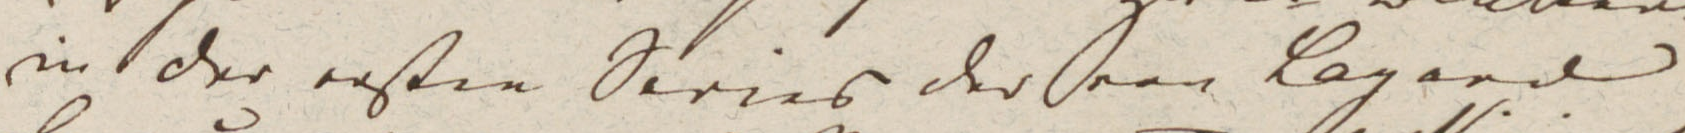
in der ersten Series der von Layard
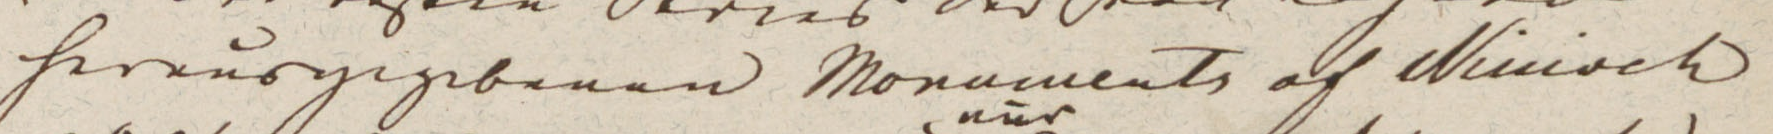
herausgegebenen Monuments of Niniveh
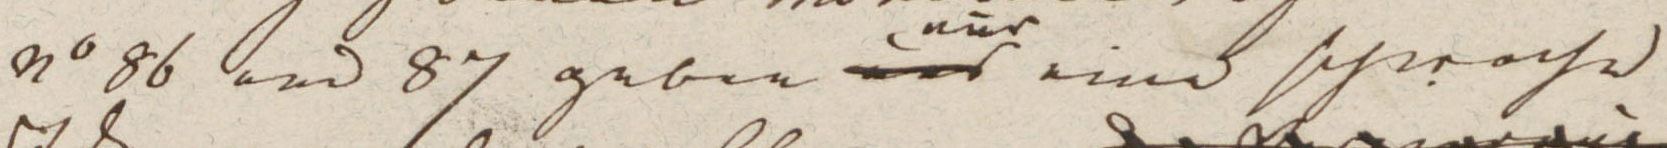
n°86 und 87 geben uns nur eine schwache
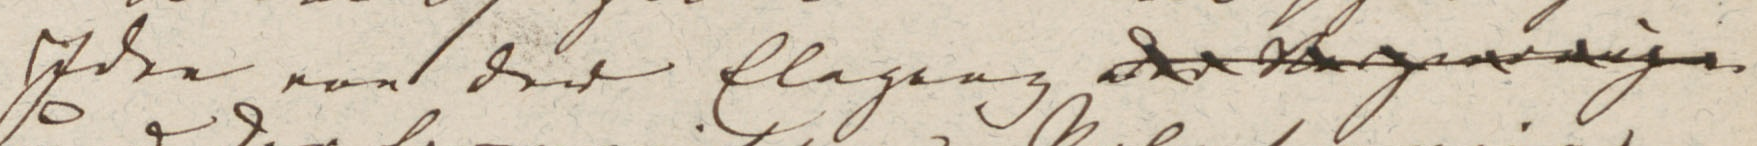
Idee von der Eleganz der Verzierungen
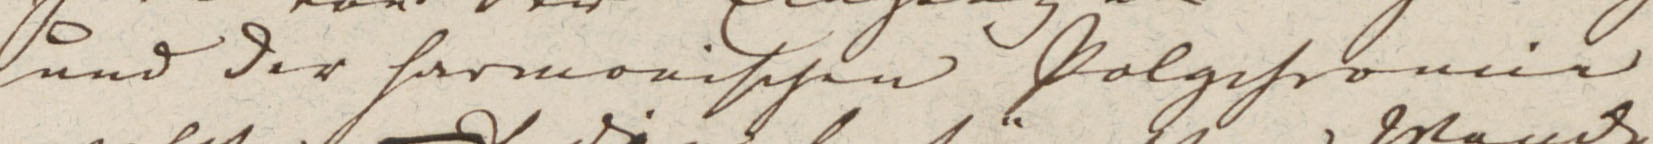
und der harmonischen Polychromie
